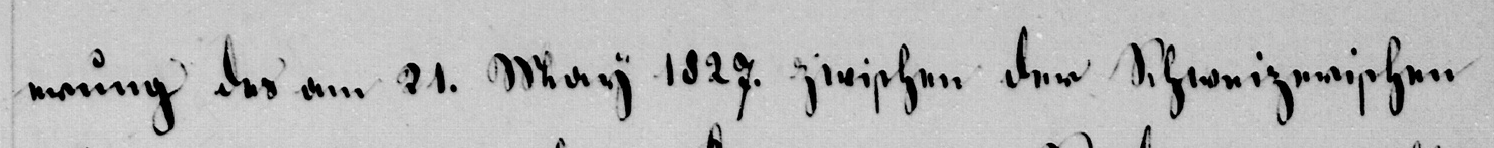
erung des am 21. May 1827. zwischen der Schweizerischen
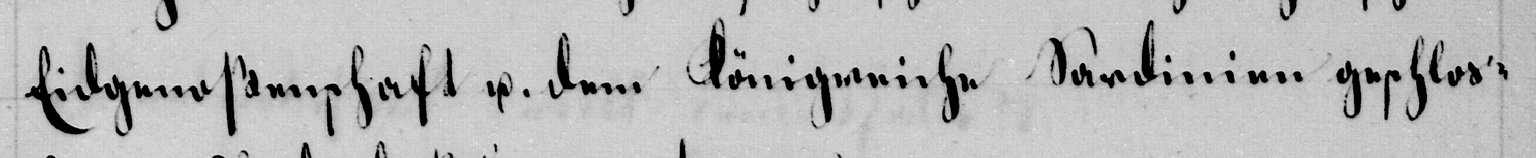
Eidgenoßenschaft u. dem Königreiche Sardinien geschloß¬
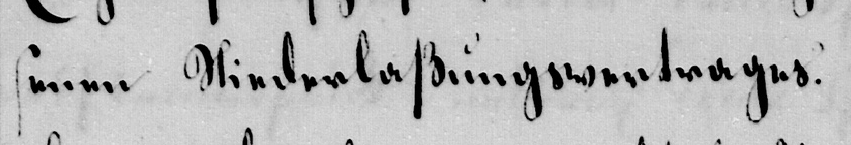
enen Niederlaßungsvertrages.
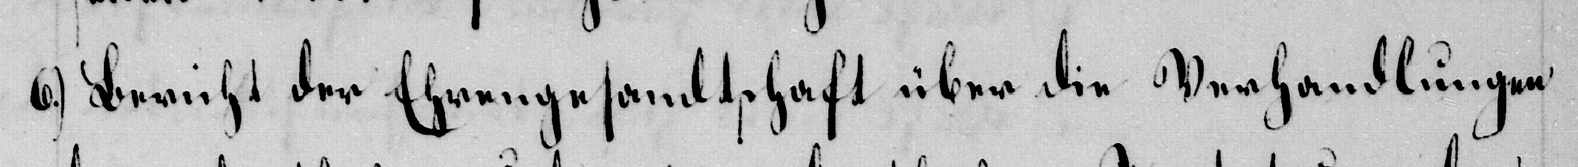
6.) Bericht der Ehrengesandtschaft über die Verhandlungen
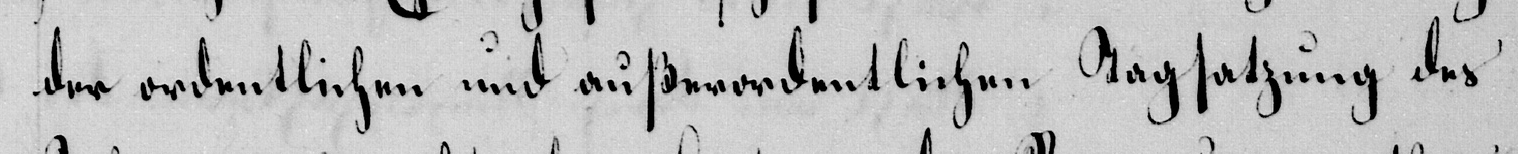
der ordentlichen und außerordentlichen Tagsatzung des
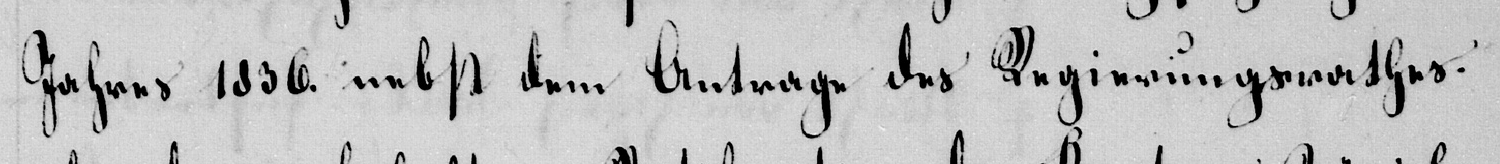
Jahres 1836. nebst dem Antrage des Regierungsrathes
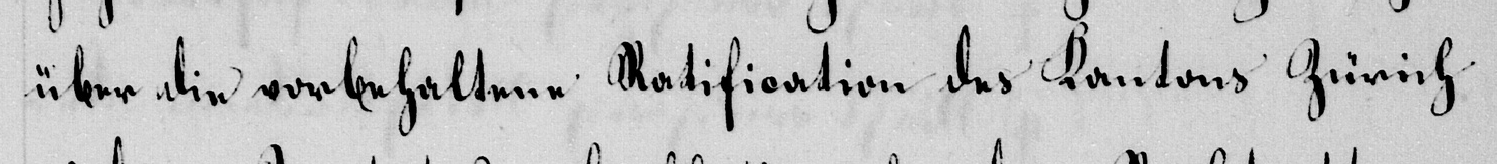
über die vorbehaltene Ratification des Kantons Zürich
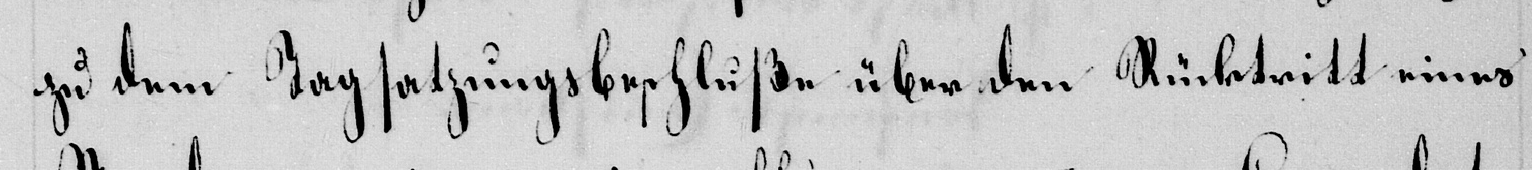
zu dem Tagsatzungsbeschluße über den Rücktritt eines
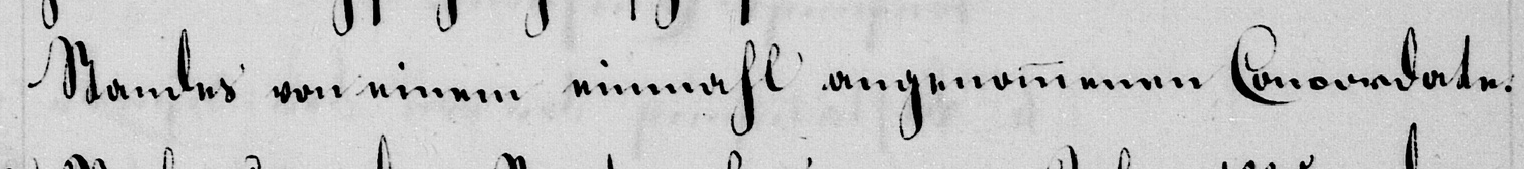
Standes von einem einmahl angenommenen Concordate.
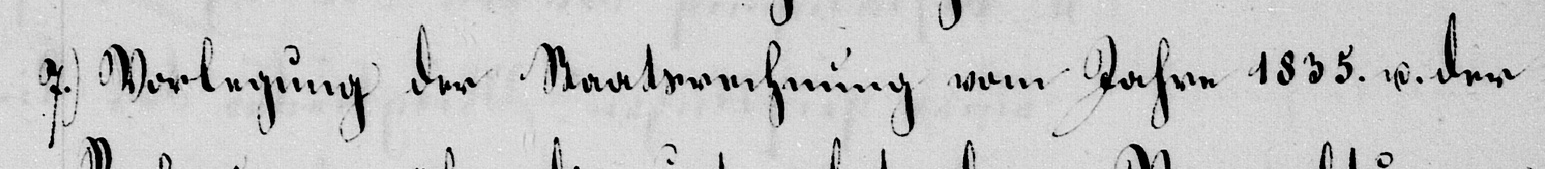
7.) Vorlegung der Staatsrechnung vom Jahre 1835. u. der
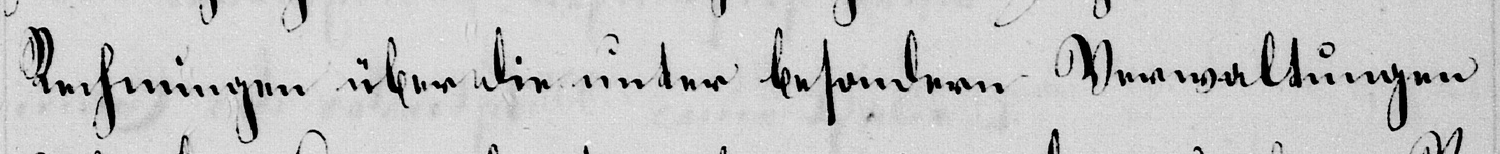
Rechnungen über die unter besondern Verwaltungen
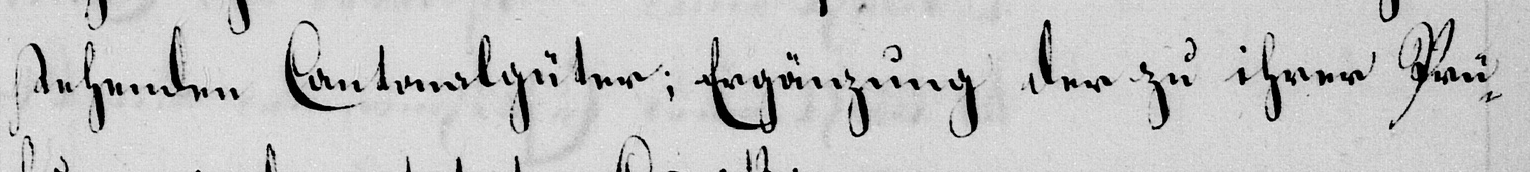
stehenden Cantonalgüter; Ergänzung der zu ihrer Prü¬
